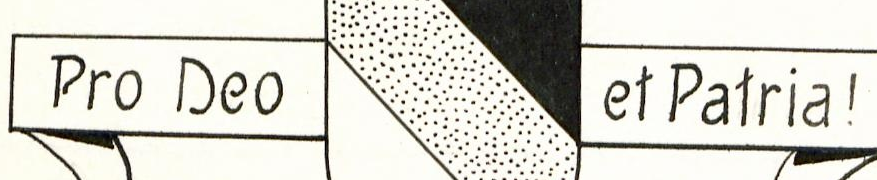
Pro Deo et Patria!
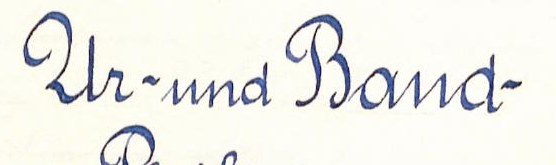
Ur- und Band-
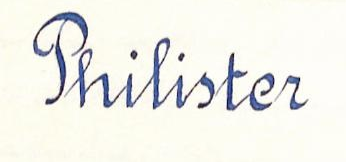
Philister
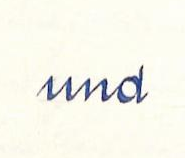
und
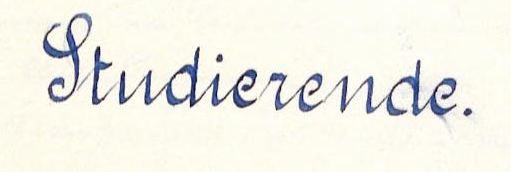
Studierende.
